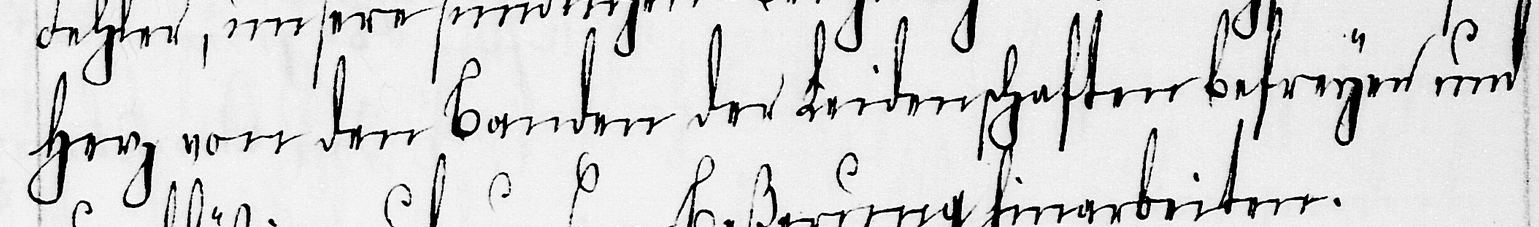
Herz von den Banden der Leidenschaften befreyen und
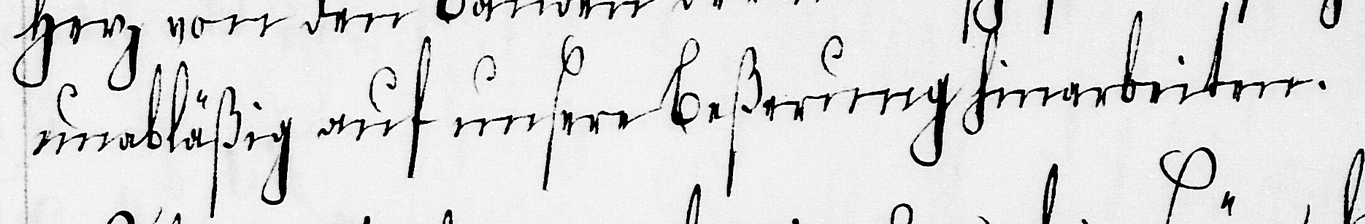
unabläßig auf unsere Beßerung hinarbeiten.
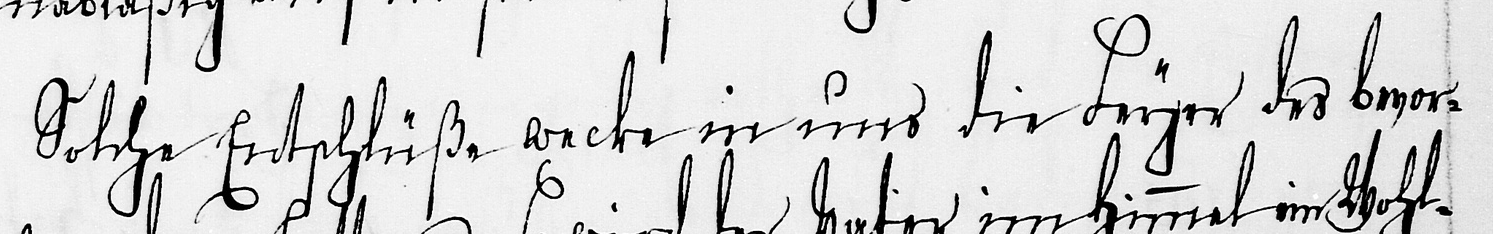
Solche Entschlüße wecke in uns die Feyer des bevor¬
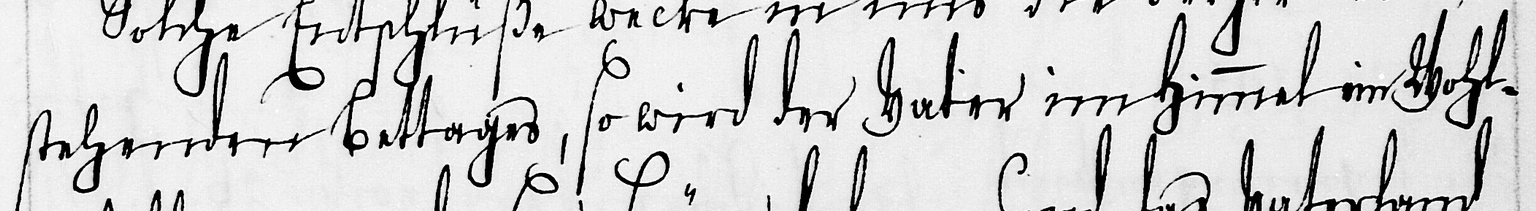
stehenden Bettages, so wird der Vater im Himmel ein Wohl¬
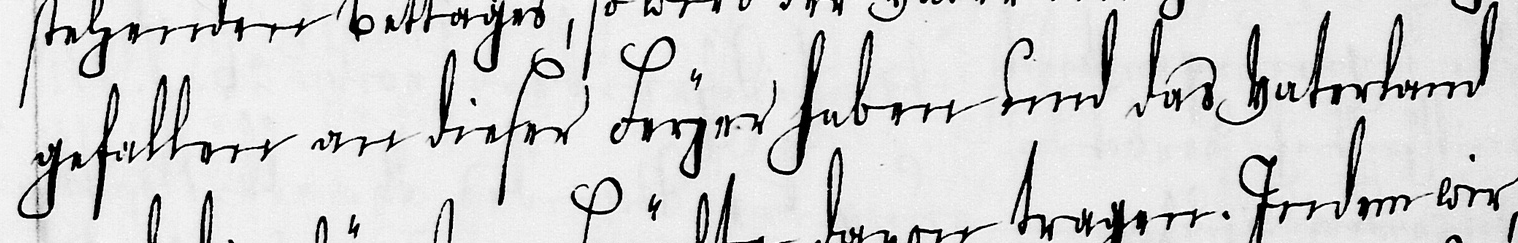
gefallen an dieser Feyer haben und das Vaterland
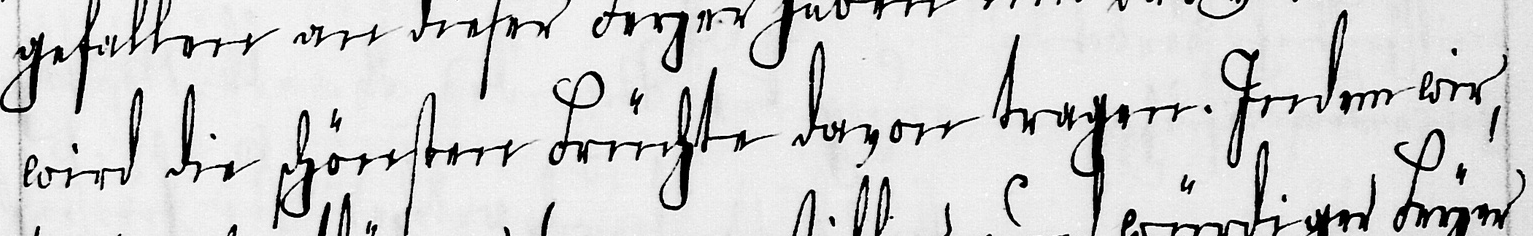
wird die schönsten Früchte davon tragen. Indem wir,
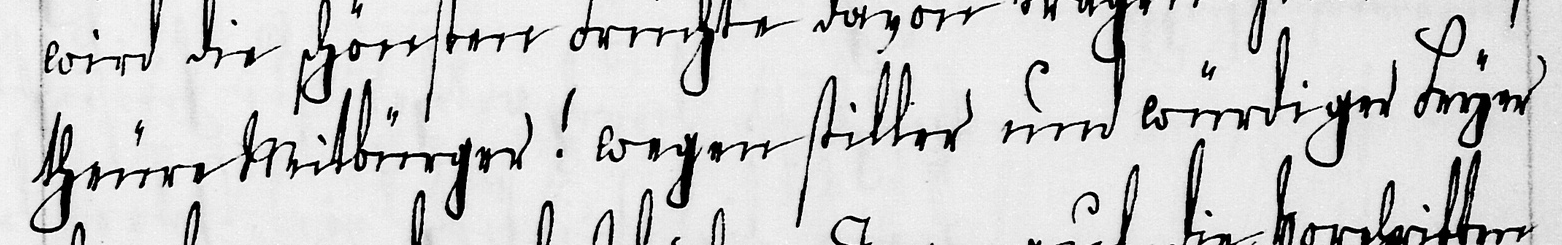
theure Mitbürger! wegen stiller und würdiger Fryer
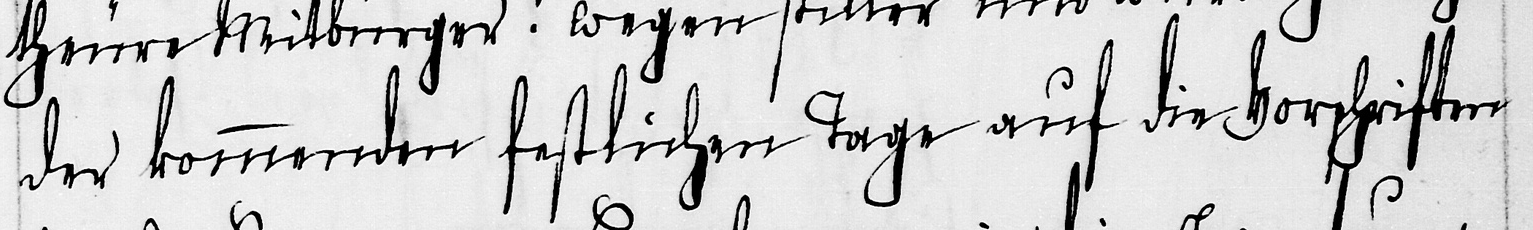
der kommenden festlichen Tage auf die Vorschriften
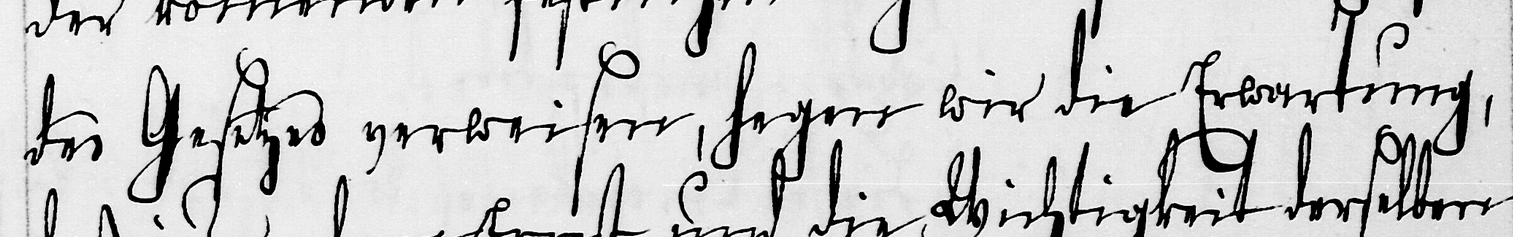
des Gesetzes verweisen, hegen wir die Erwartung,
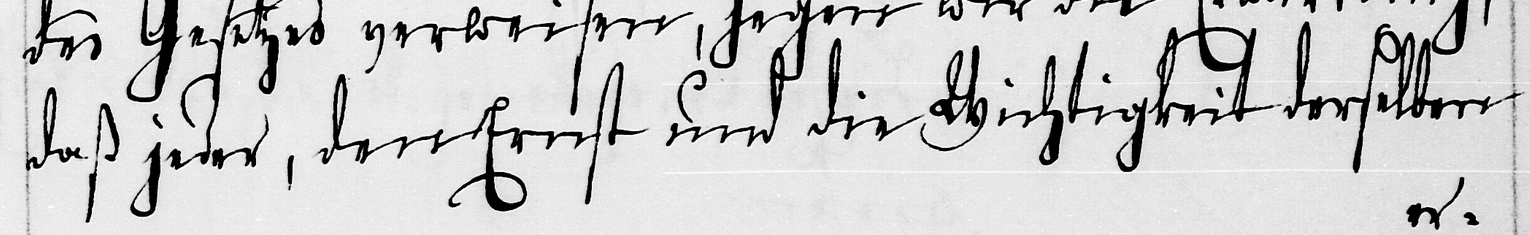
daß jeder, den Ernst und die Wichtigkeit derselben
